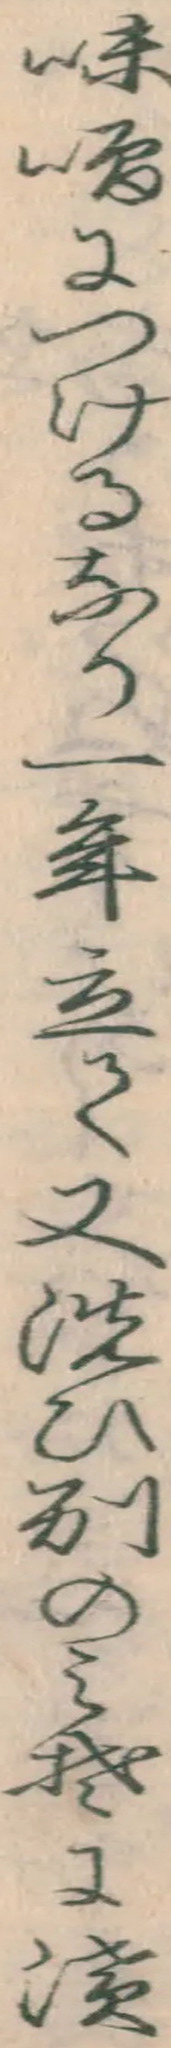味噌につけるなり一年立て又洗ひ別のみそに漬
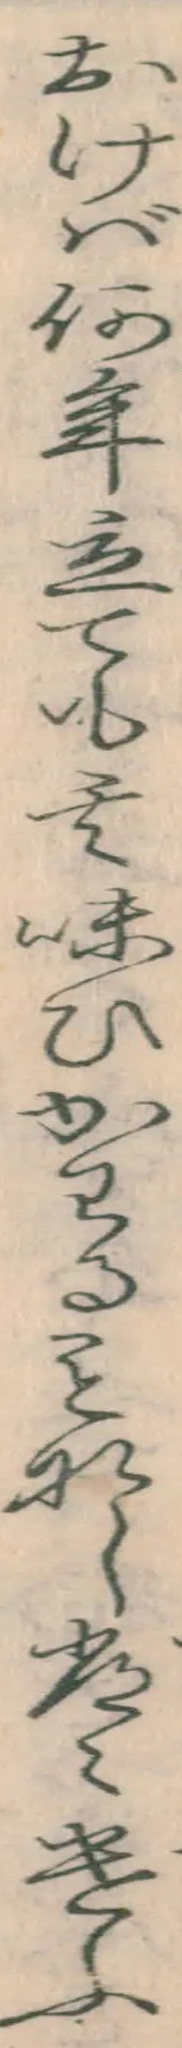おけば何年立ても其味ひかわることなし常々遣ふ
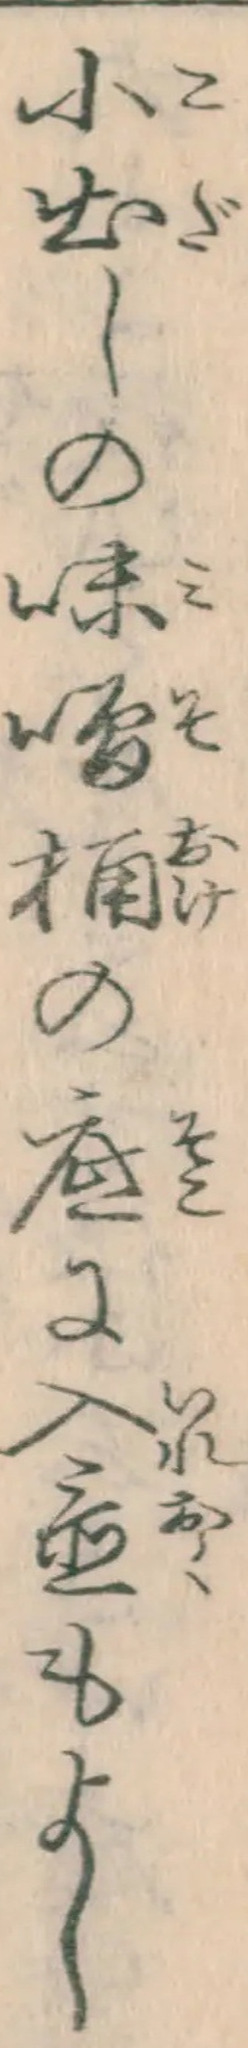小出しの味噌桶の底に入置もよし
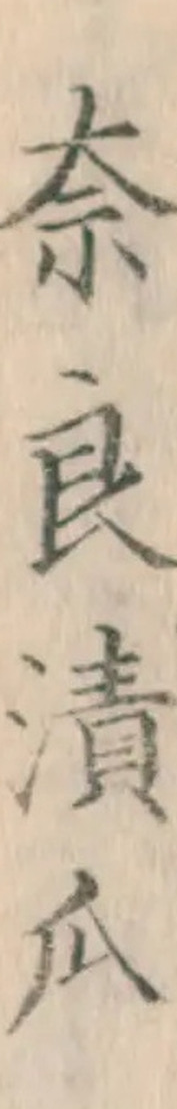奈良漬瓜
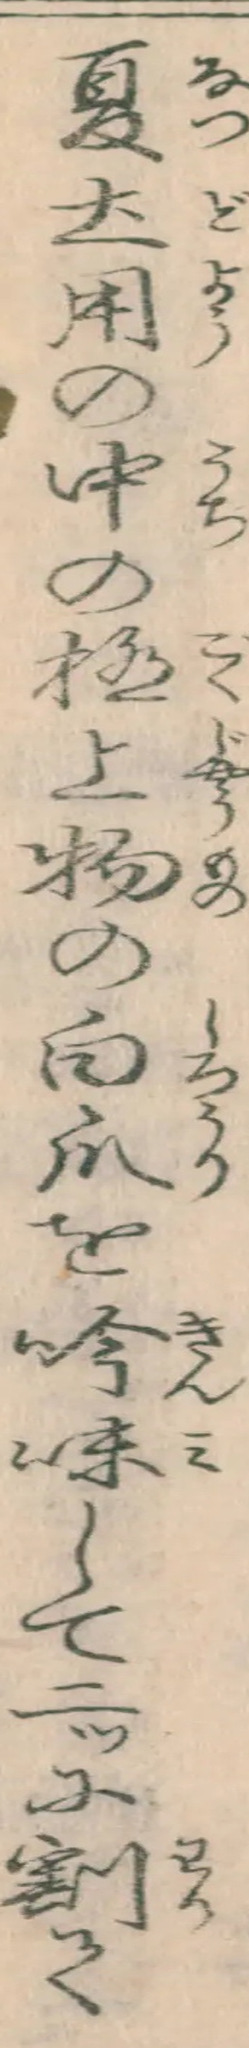夏土用の中の極上物の白瓜を吟味して二ッに割て
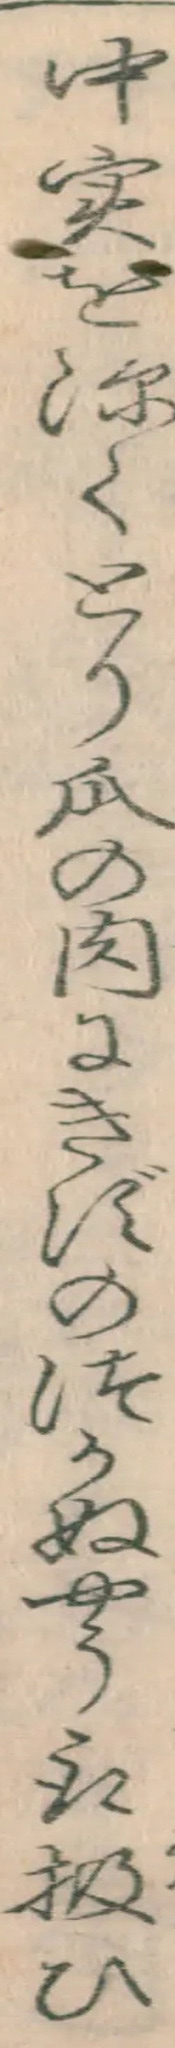中実を深くとり瓜の肉にきずのつかぬやう取扱ひ

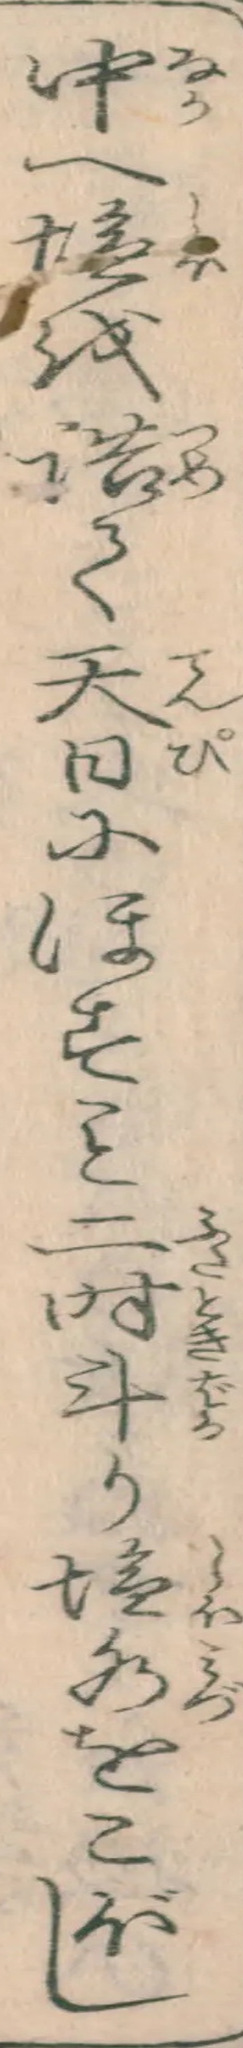中へ塩を詰て天日にほすこと二時斗り塩水をこぼし
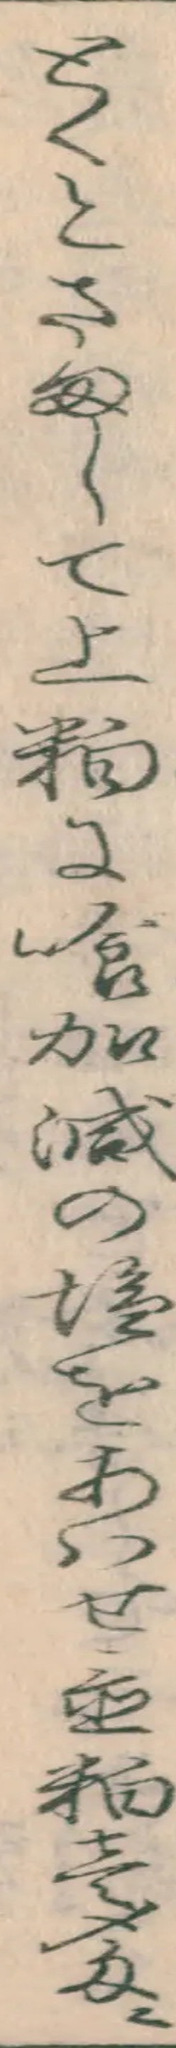とくとさまして上粕に喰加減の塩をあはせ置粕一〆匁に
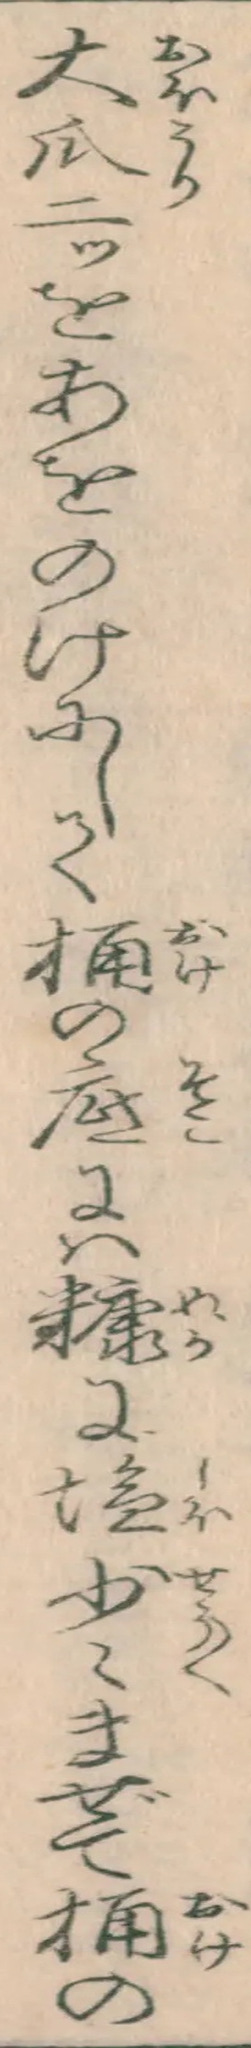大瓜二ッをあをのけにして桶の底には糠に塩少々まぜて桶の
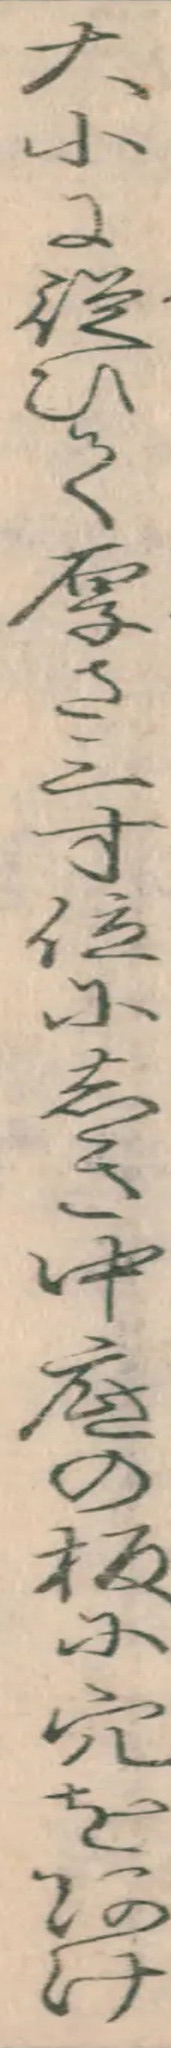大小に従ひて厚さ三寸位にしき中底の板に穴をあけ
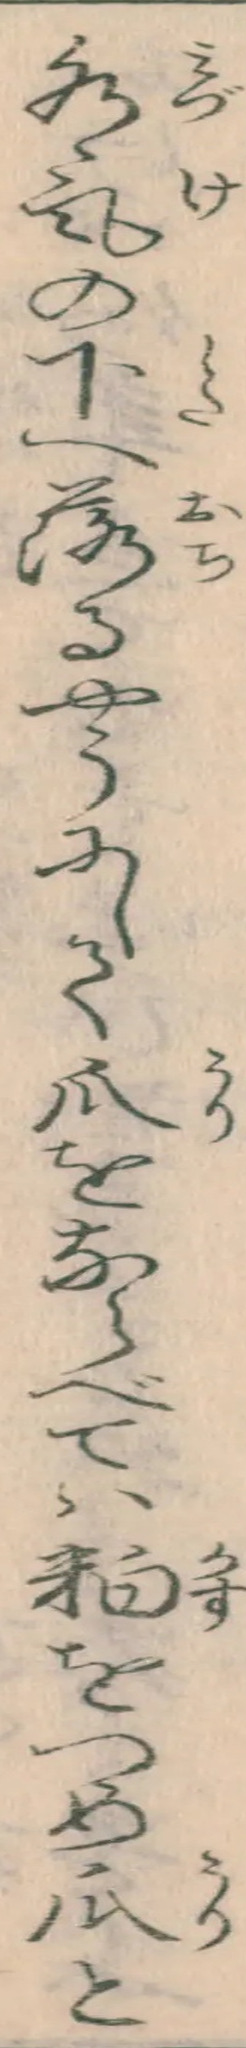水気の下へ落るやうにして瓜をならべては粕をつめ瓜と
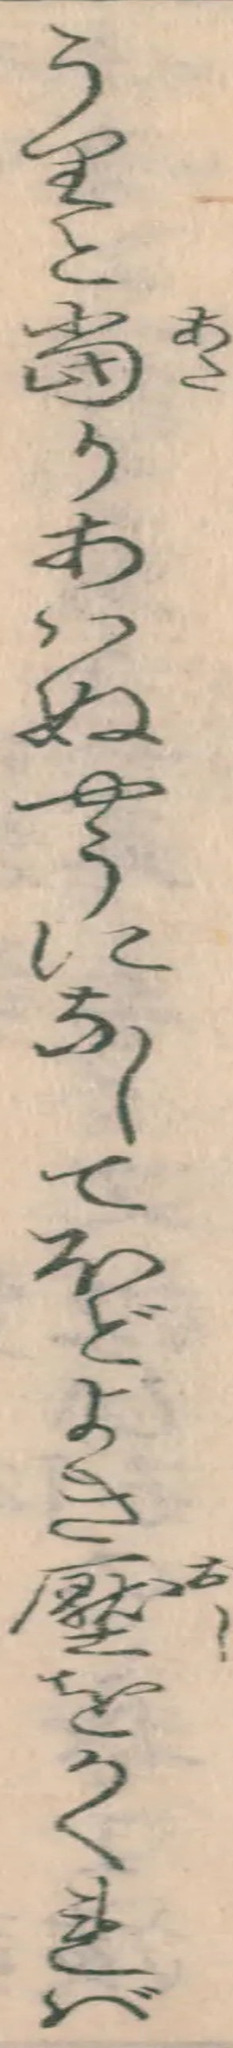うりと当りあはぬやうになしてほどよき圧をかくれば
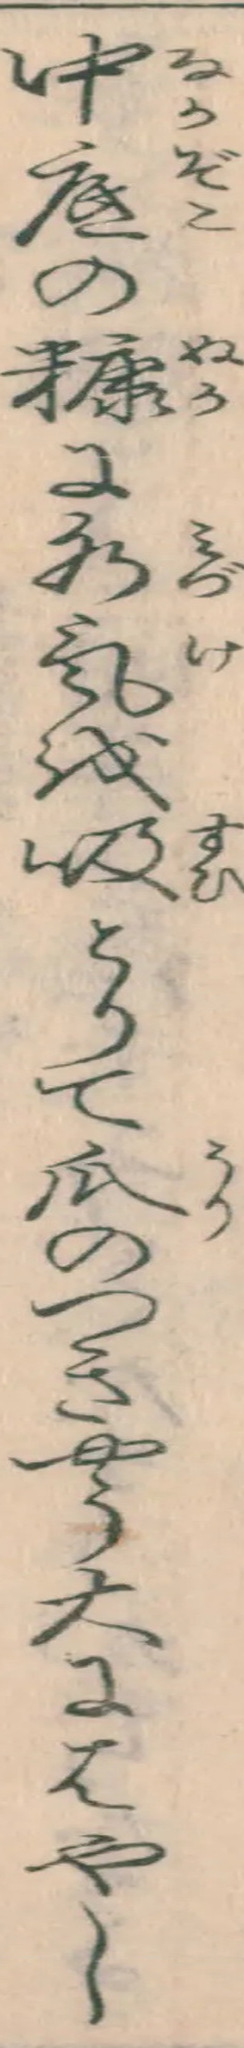中底の糠に水気を吸とりて瓜のつきやう大にはやし
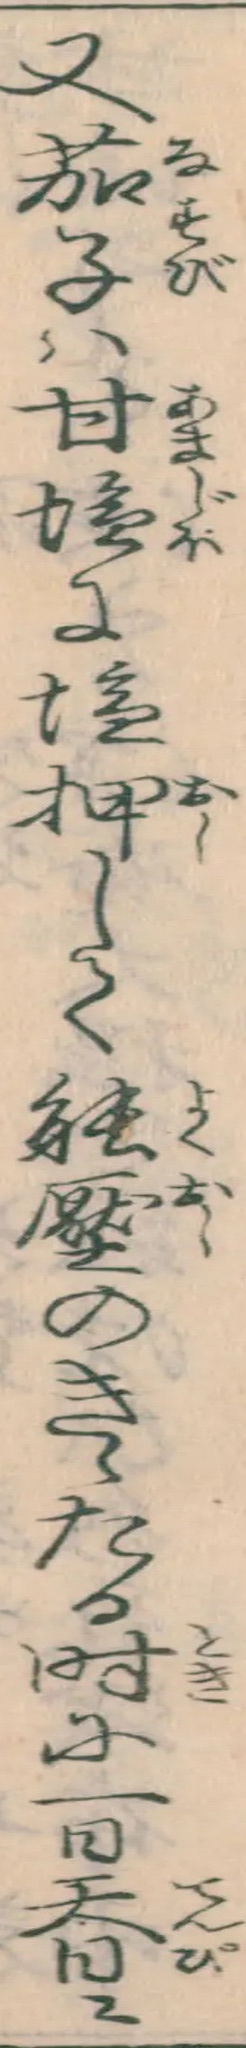又茄子は甘塩に塩押して能圧のきゝたる時に一日天日に
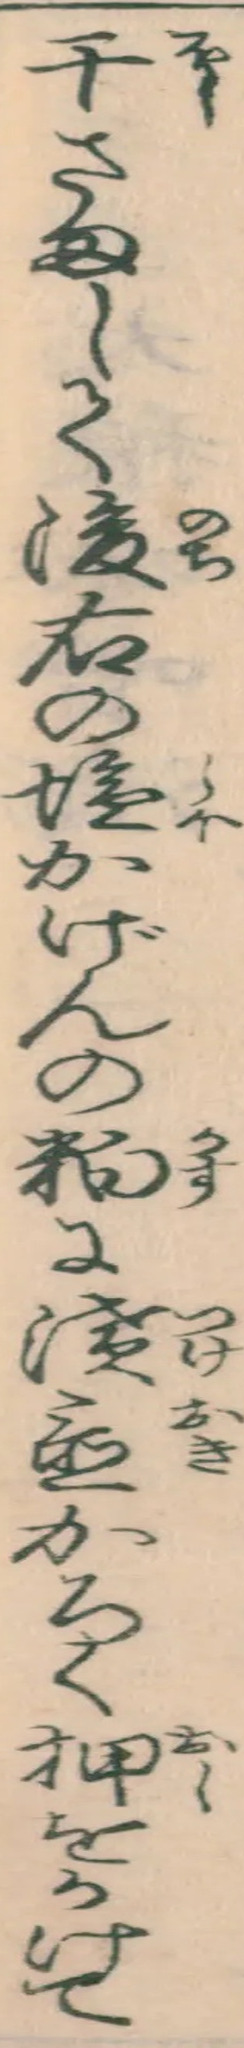干さまして後右の塩かげんの粕に漬置かろく押をかけて
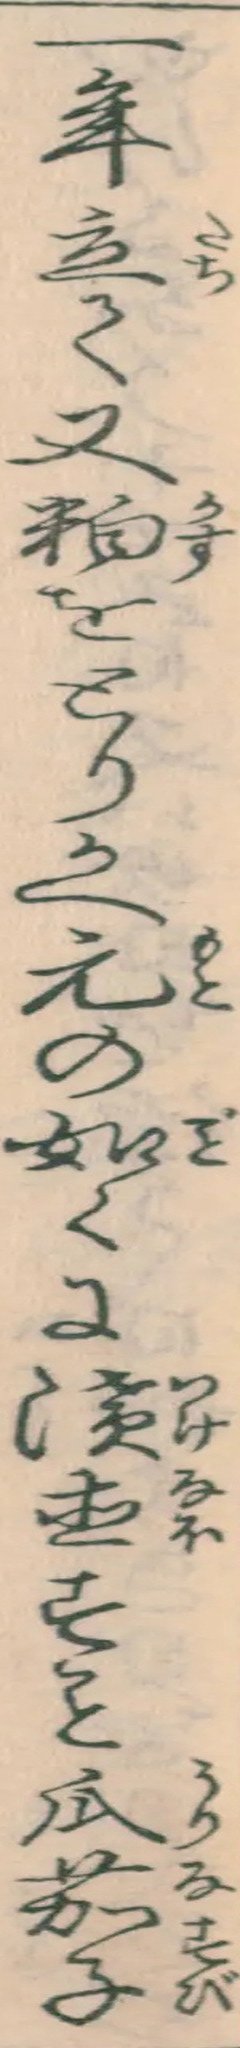一年立て又粕をとりかへ元の如くに漬直すこと瓜茄子
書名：四季漬物鹽嘉言
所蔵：国立国会図書館 National Diet Library, JAPAN
